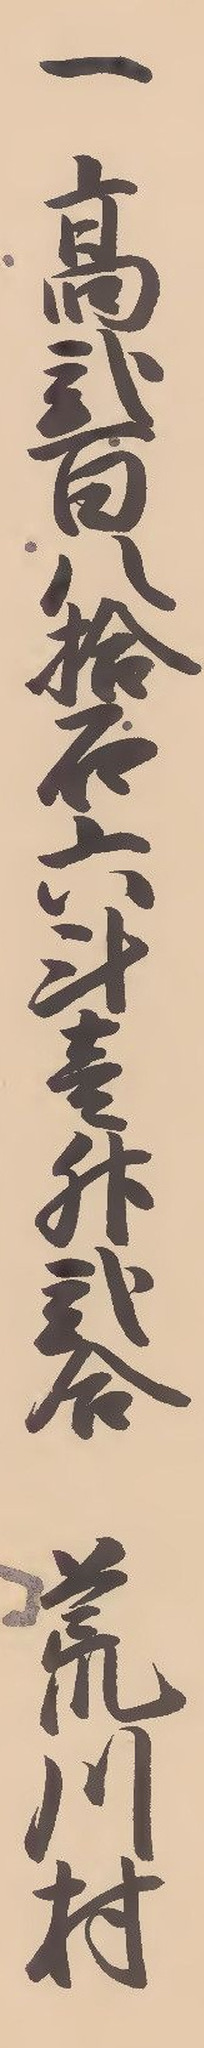一髙弐百八拾石六斗壱升弐合荒川村

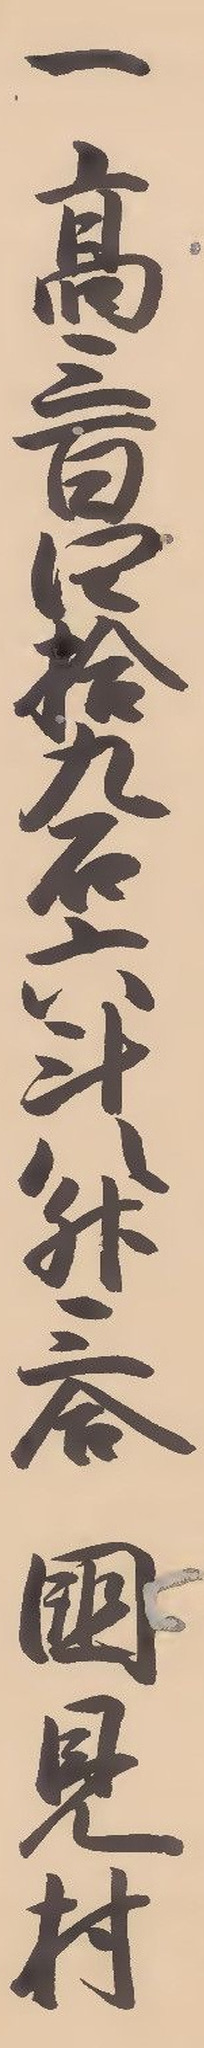一髙三百四拾九石六斗八升三合國見村
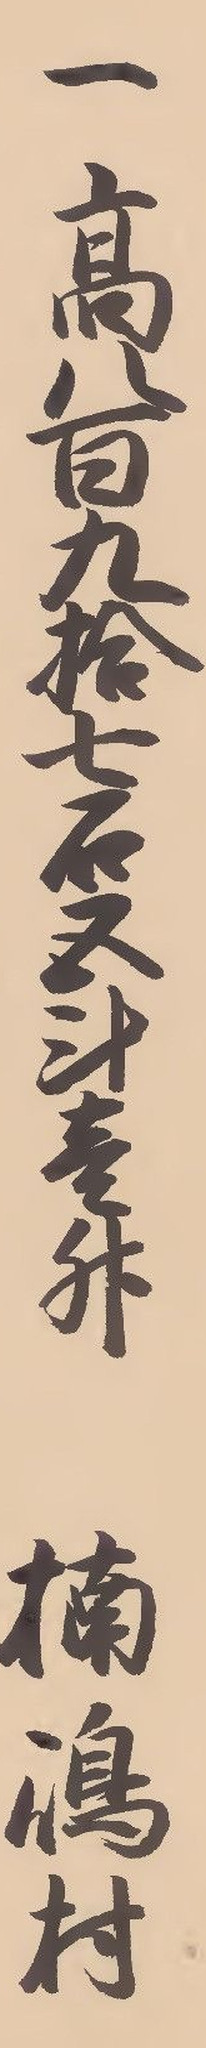一髙八百九拾七石五斗壱升楠嶋村
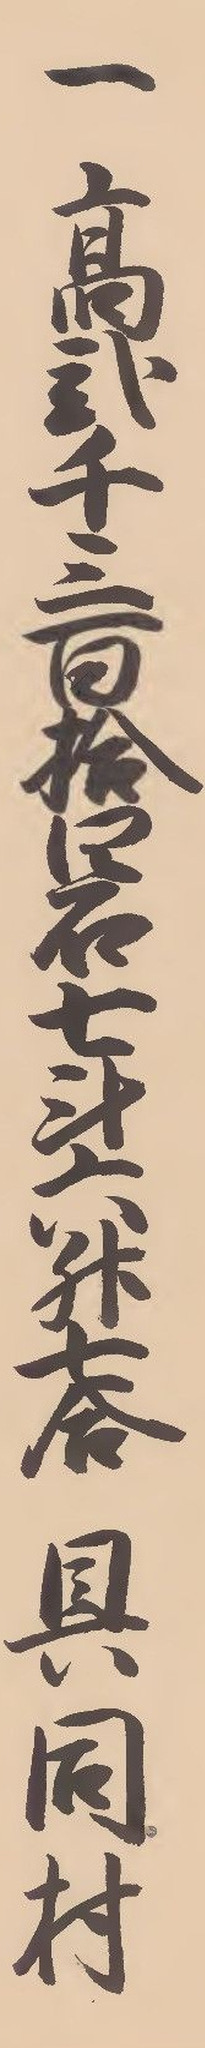一髙弐千三百拾四石七斗六升七合具同村
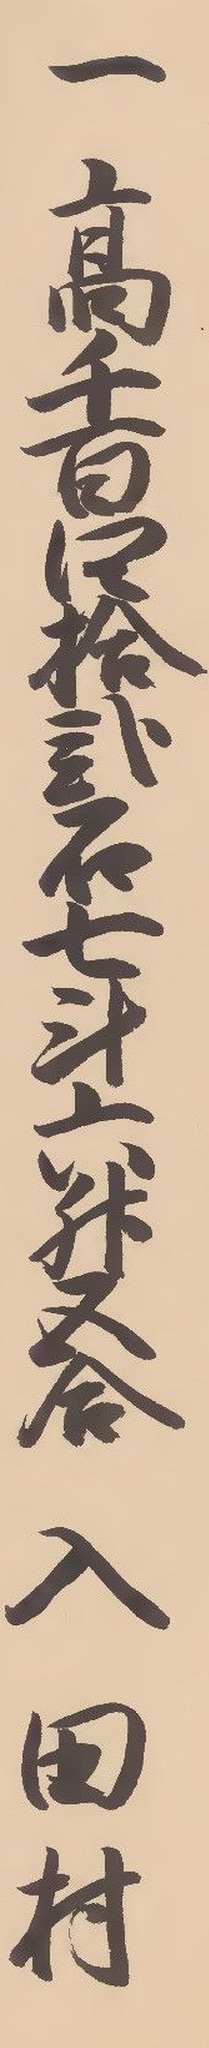一髙千百四拾弐石七斗六升五合入田村
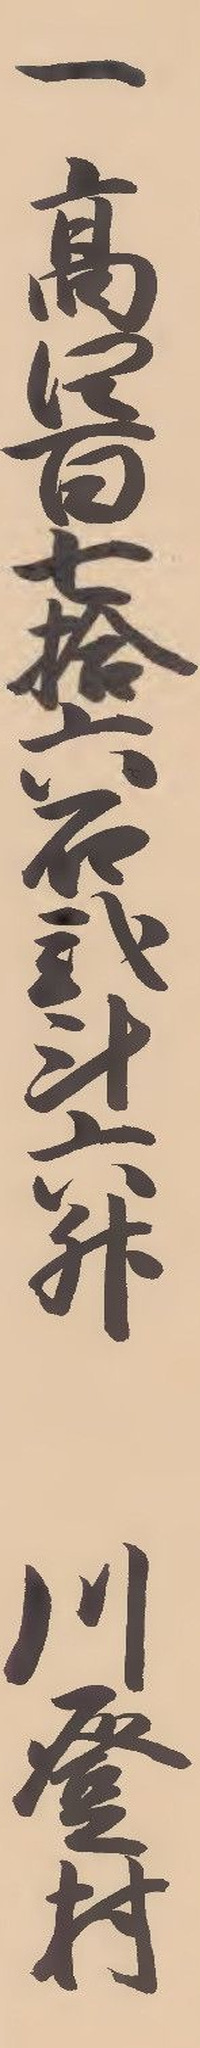一髙四百七拾六石弐斗六升川登村
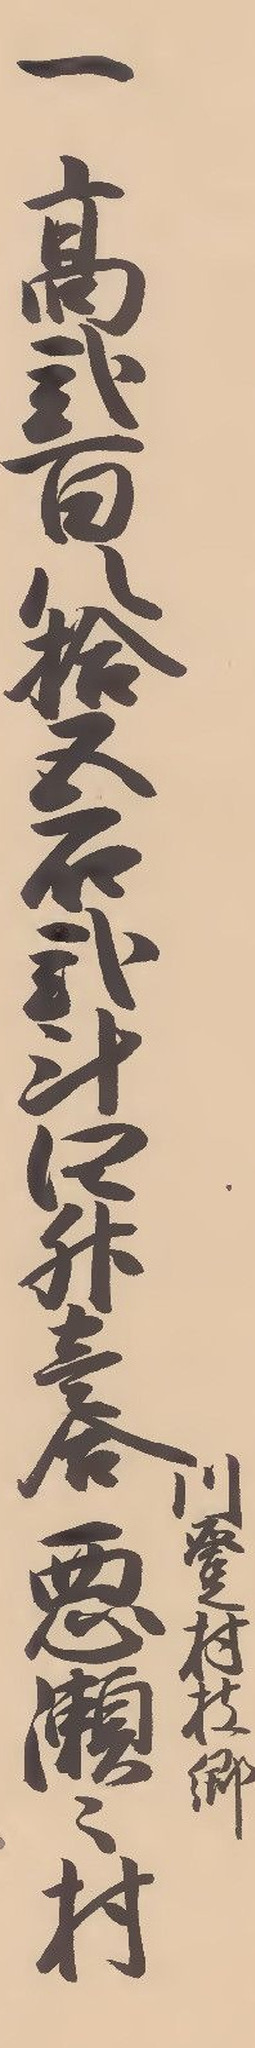一髙弐百八拾五石弐斗四升壱合悪瀬々村
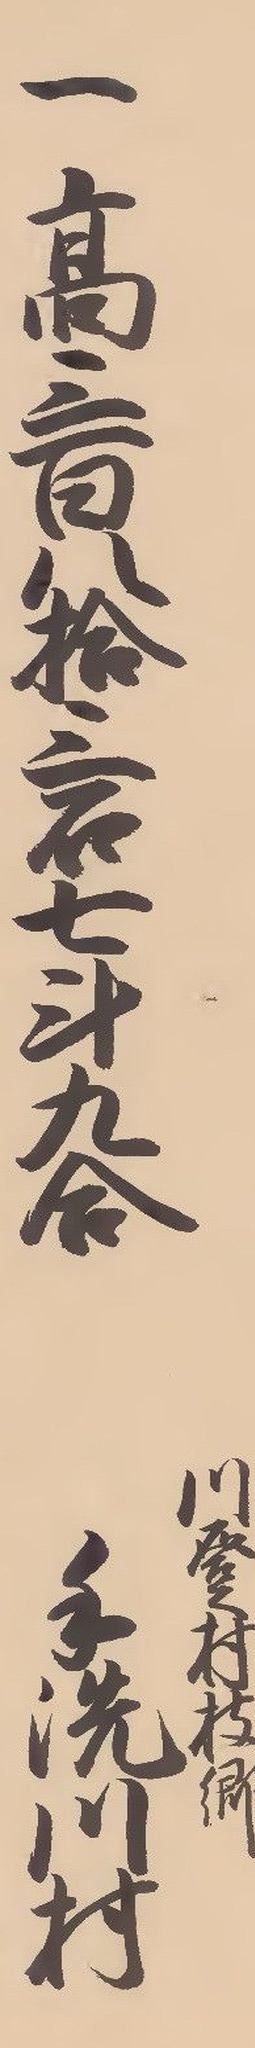一髙三百八拾三石七斗九合手洗川村
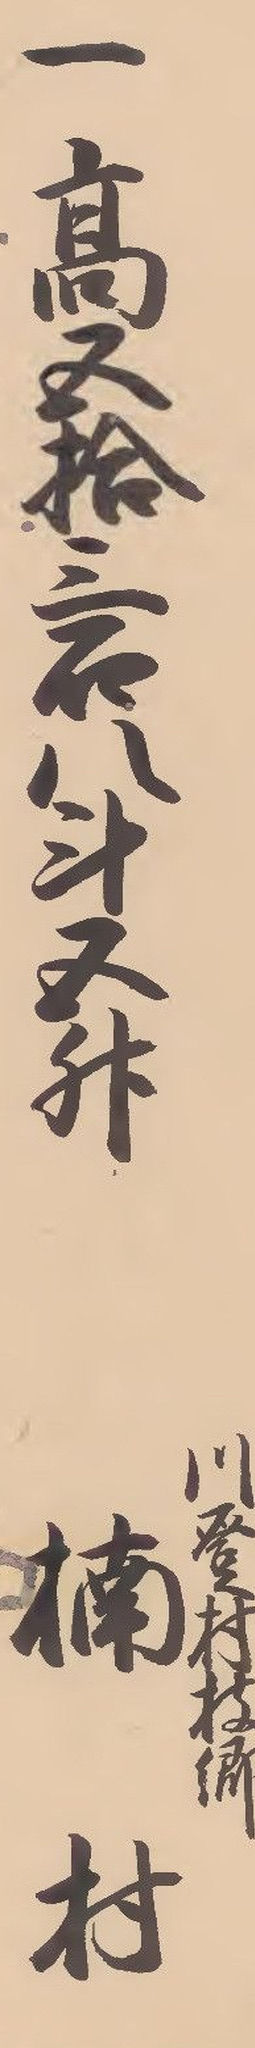一髙五拾三石八斗五升楠村

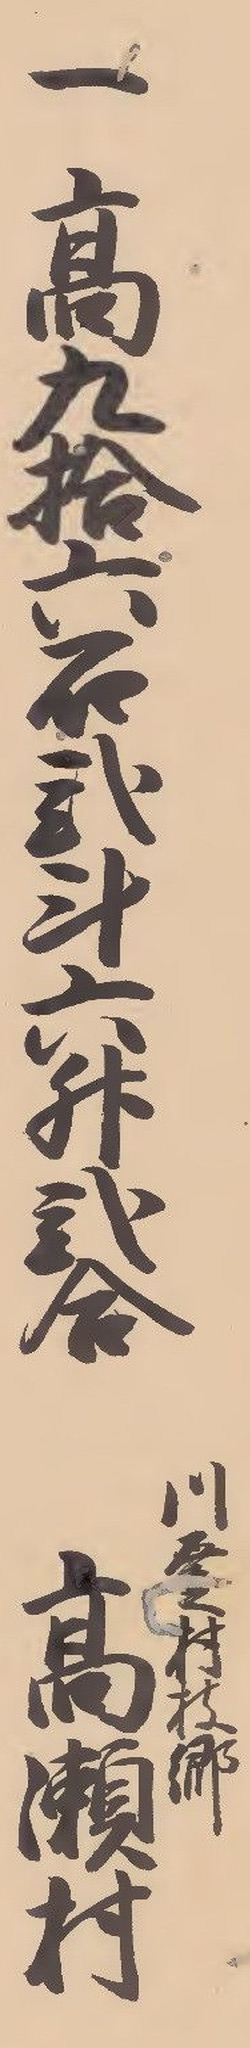一髙九拾六石弐斗六升弐合高瀬村
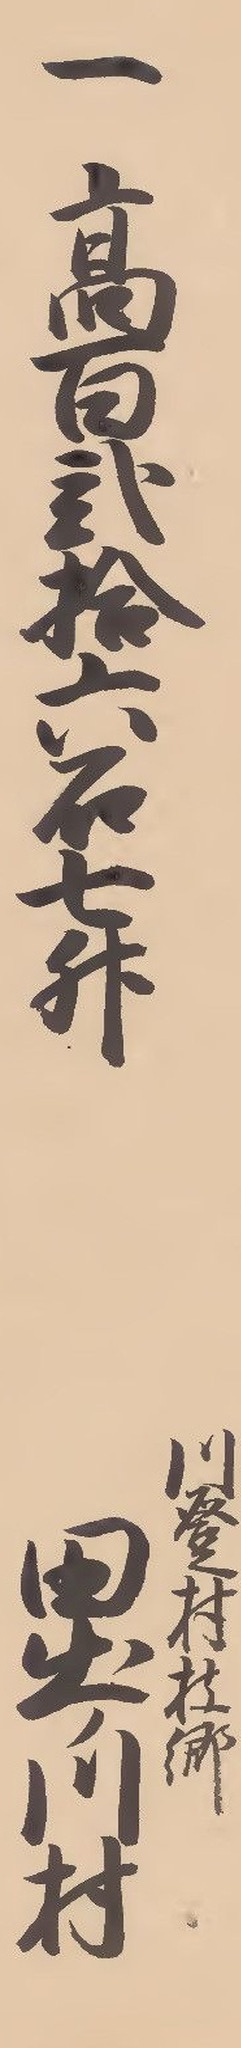一髙百弐拾六石七升田出ノ川村
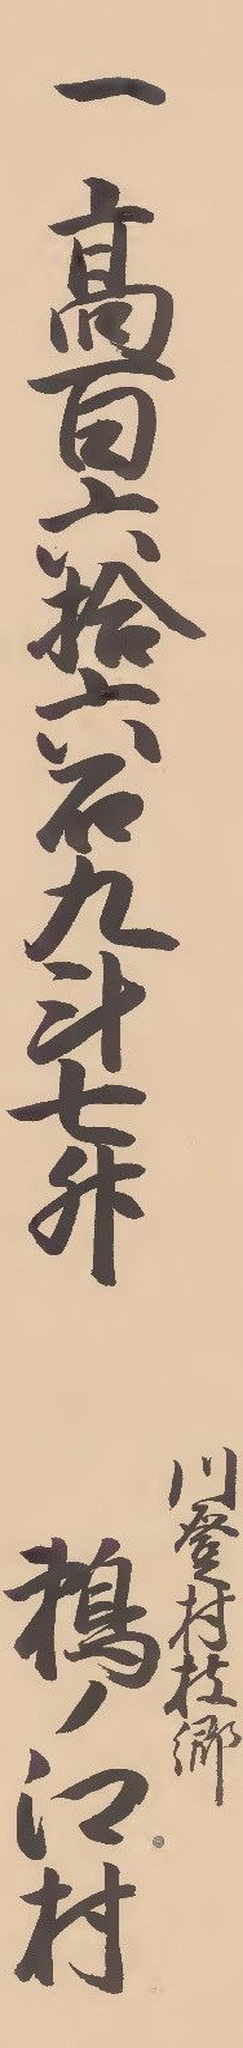一髙百六拾六石九斗七升鵜ノ江村
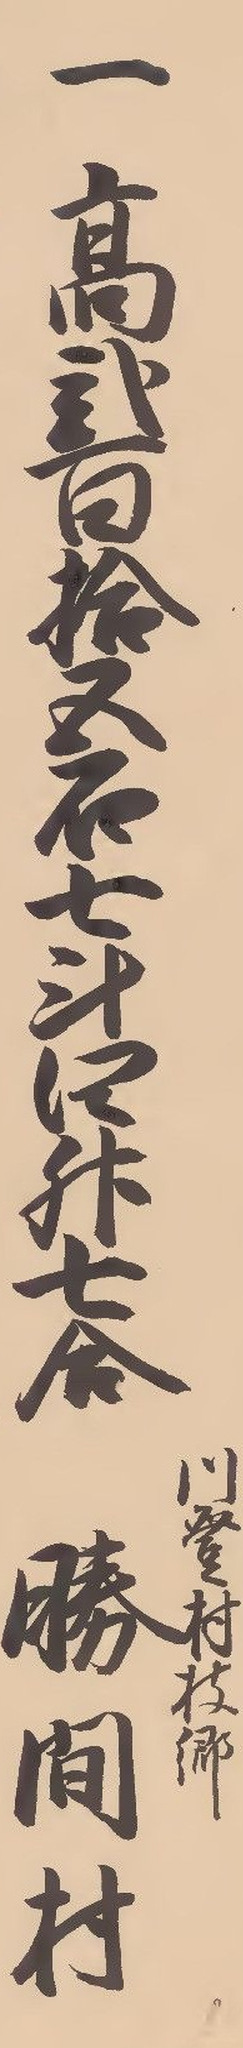一髙弐百拾五石七斗四升七合勝間村
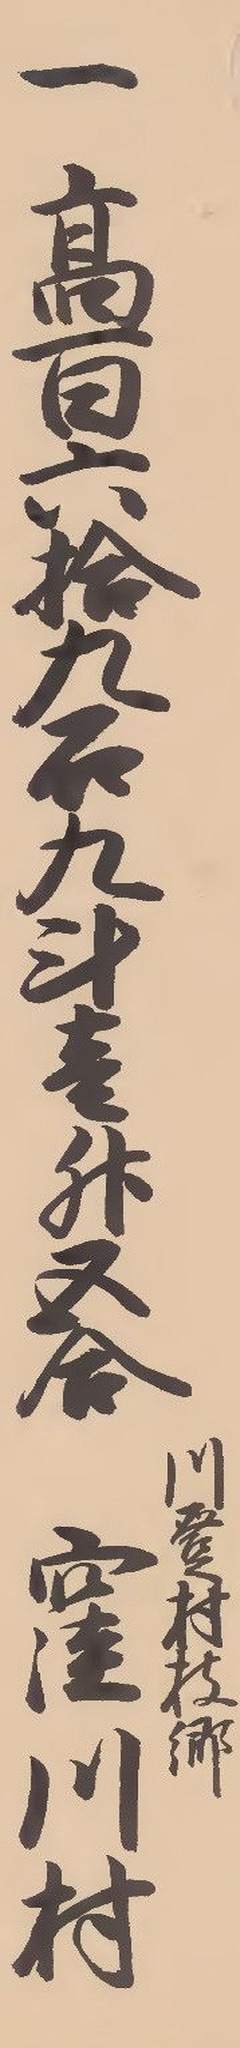一高百六拾九石九斗壱升五合窪川村
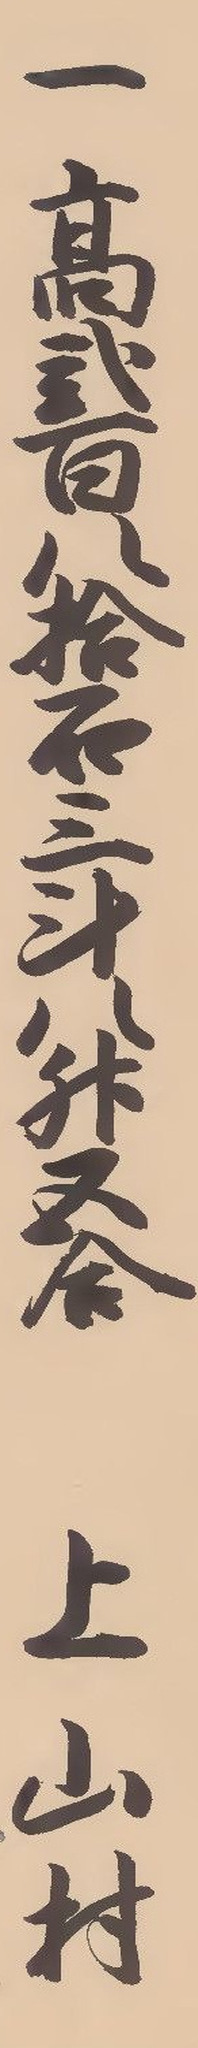一高弐百八拾石三斗八升五合上山村
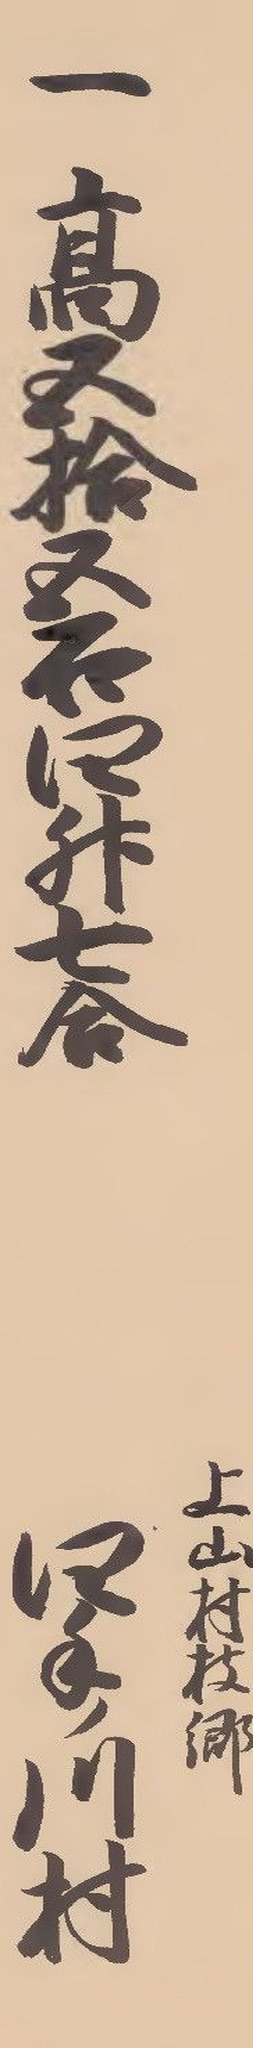一髙五拾五石四升七合四出ノ川村
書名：土佐国郷帳
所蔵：国立公文書館 National Archives of Japan
